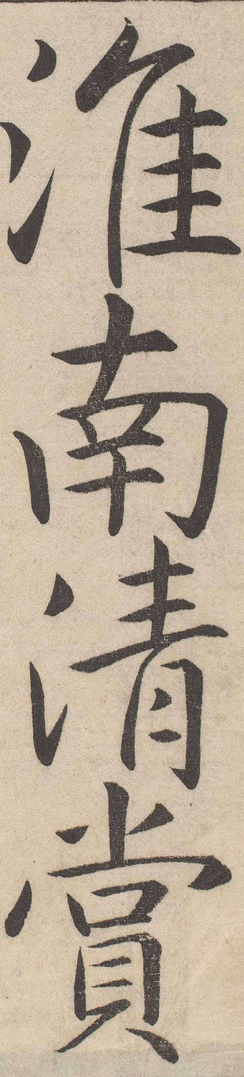淮南清賞
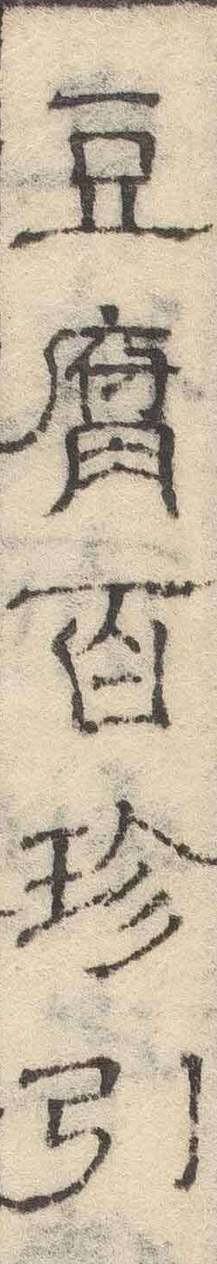豆腐百珍引
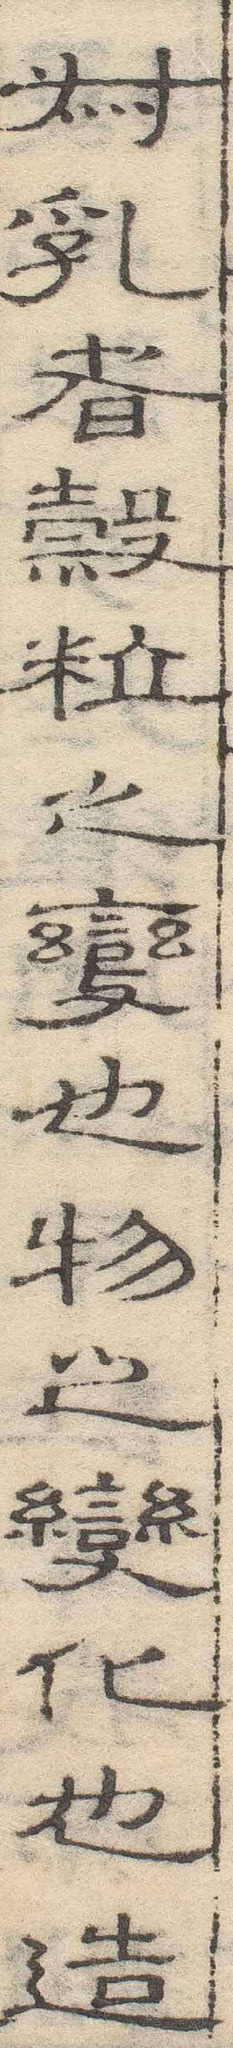叔乳者穀粒之変也物之変化也造
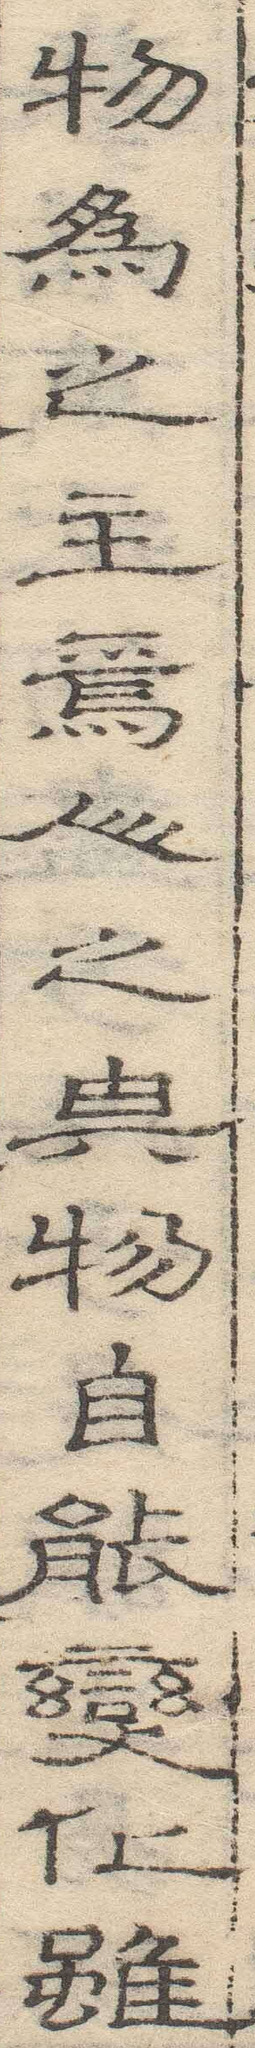物為之主焉人之異物自能変化雖
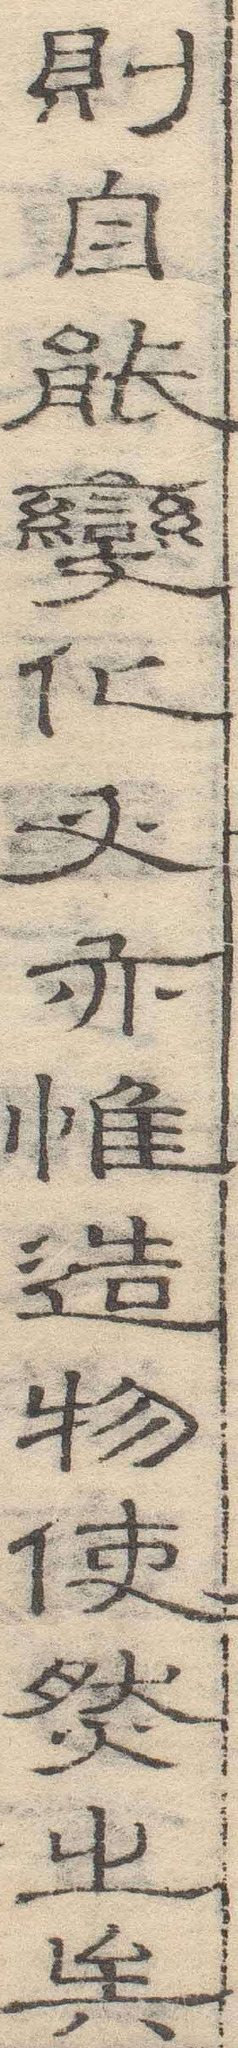則自能変化必亦惟造物使然之矣
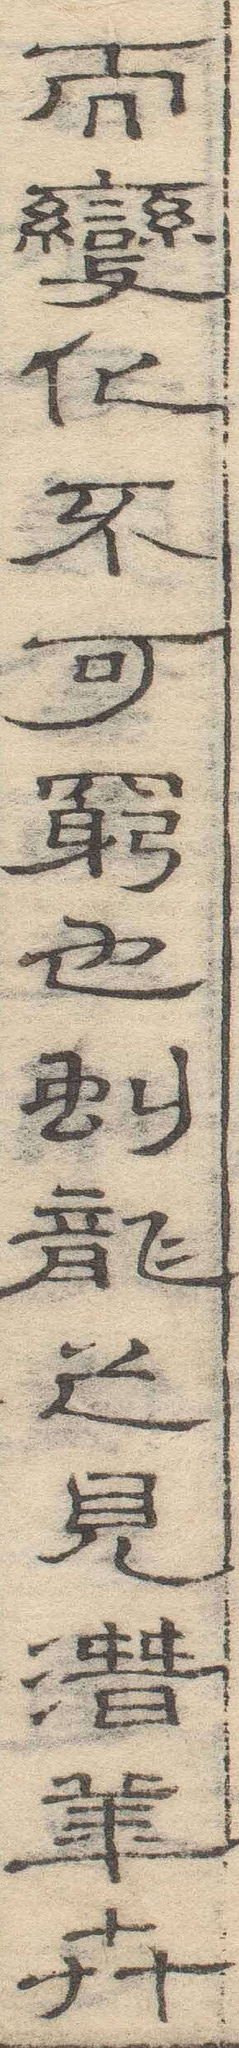而変化不可窮也虯竜之見潜華卉
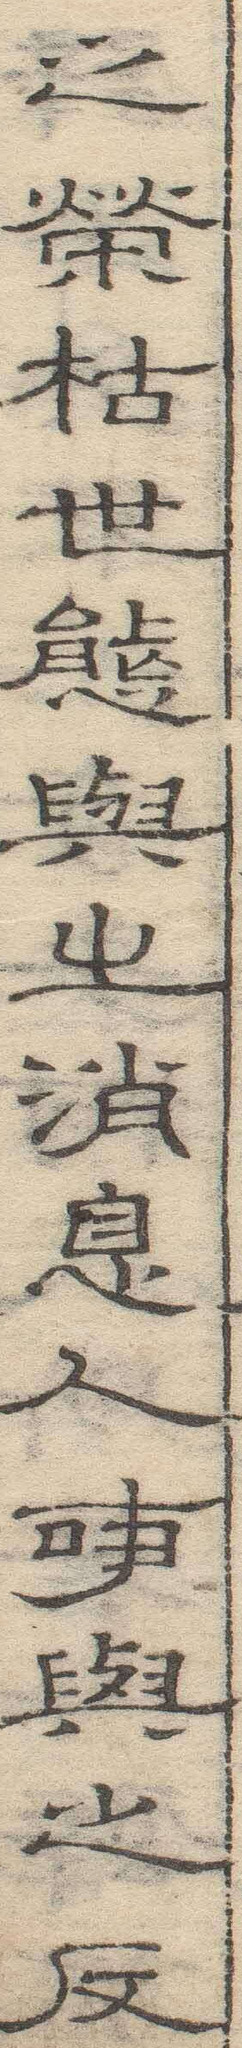之栄枯世態与之消息人事与之反
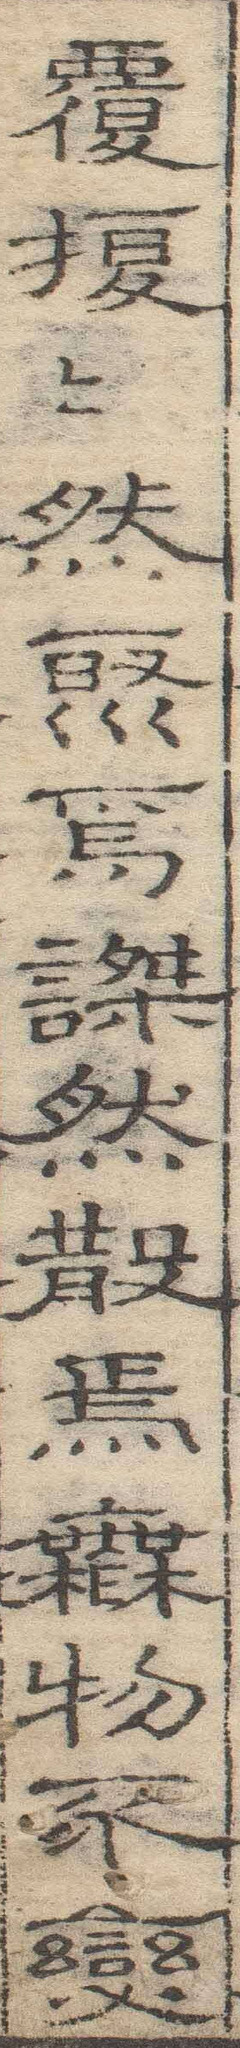覆復々然聚焉謋然散焉無物不変
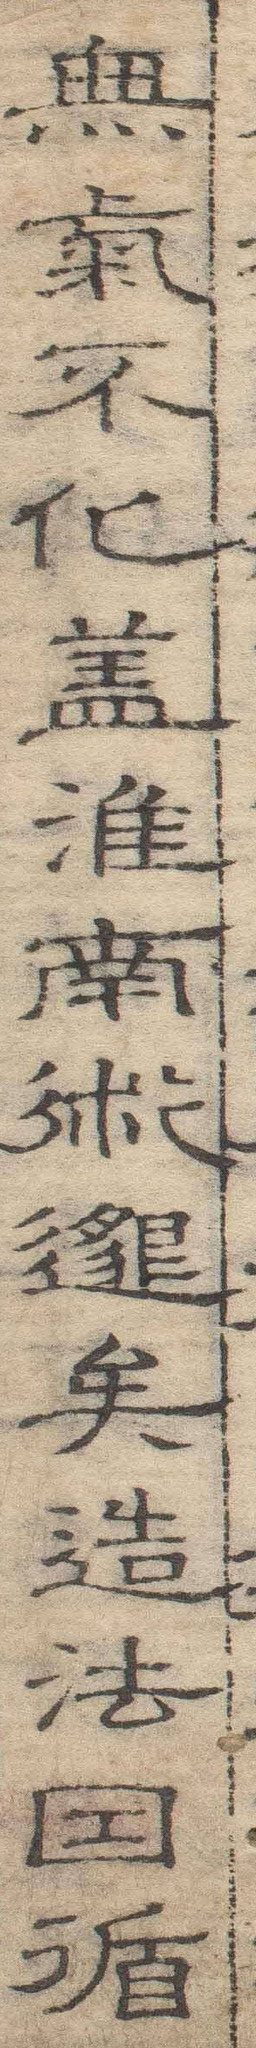無気不化蓋淮南術遥矣造法因循

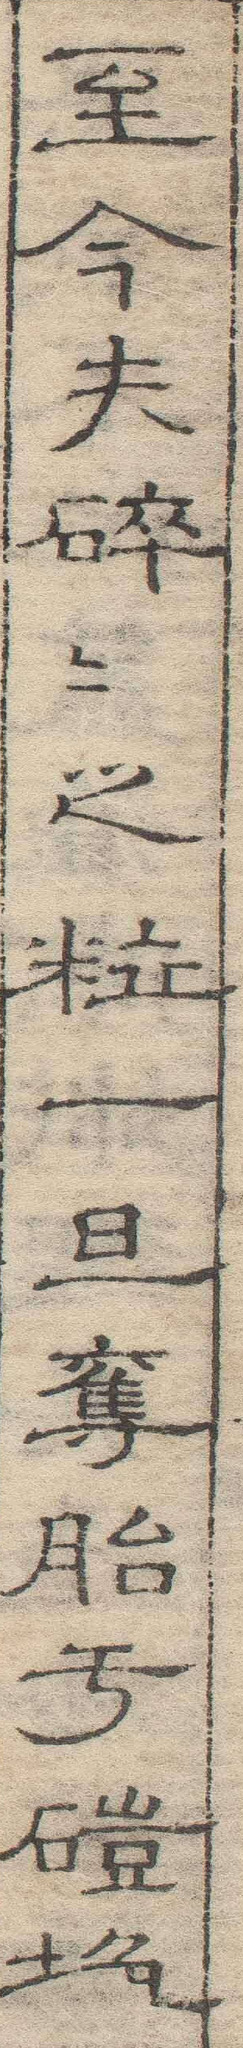至今夫碎々之粒一旦奪胎于磑換
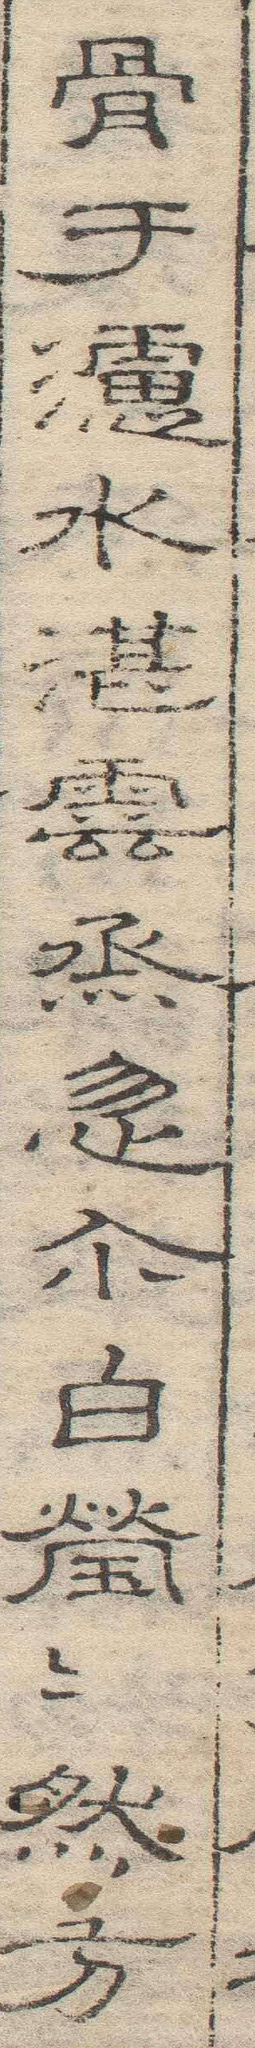骨于濾水湛雲蒸忽爾白瑩々然方
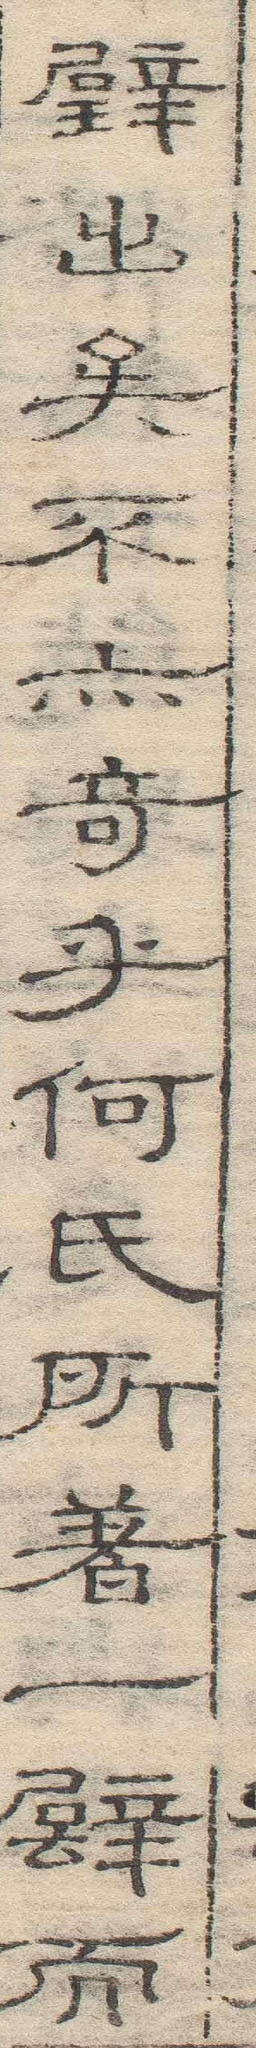璧出矣不亦奇乎何氏所著一璧而
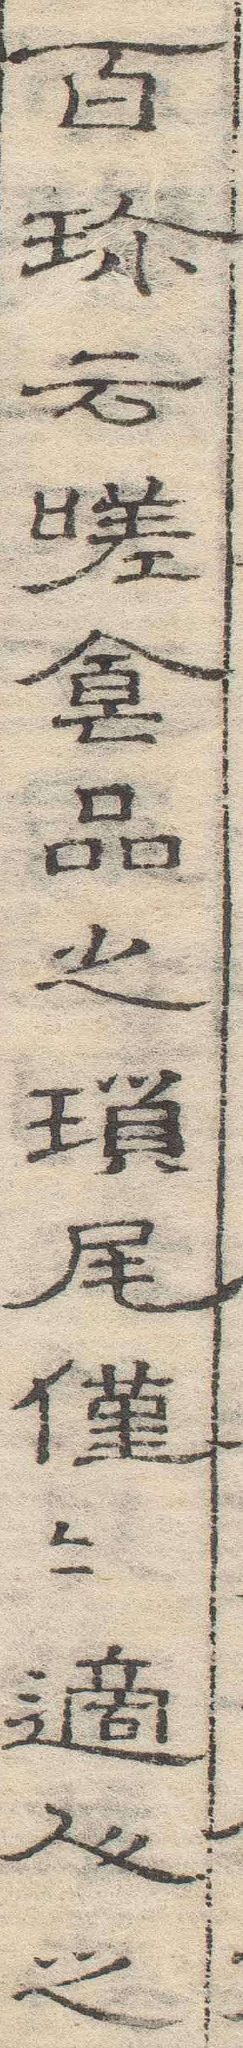百珍云嗟食品之瑣尾僅々適人之
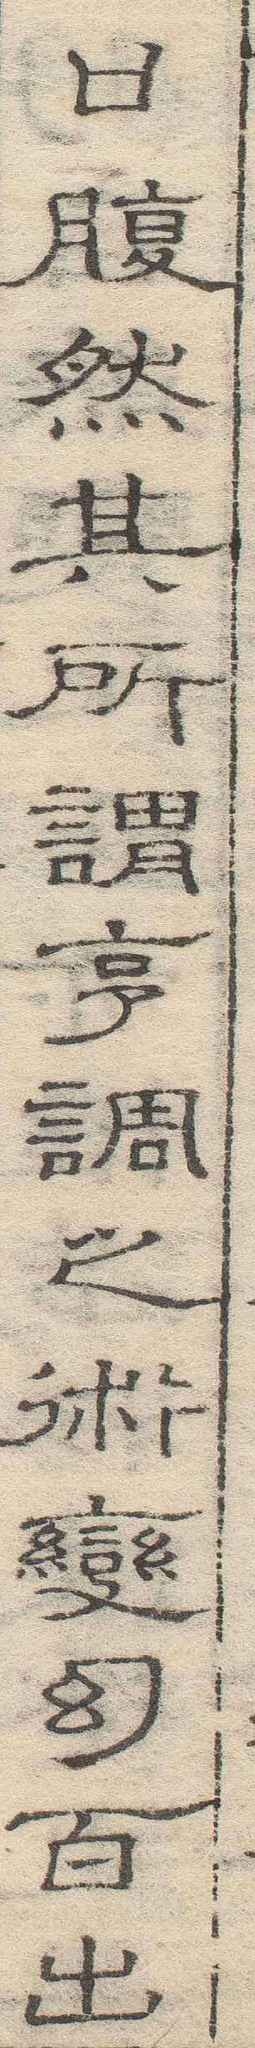口腹然其所謂亨調之術変幻百出
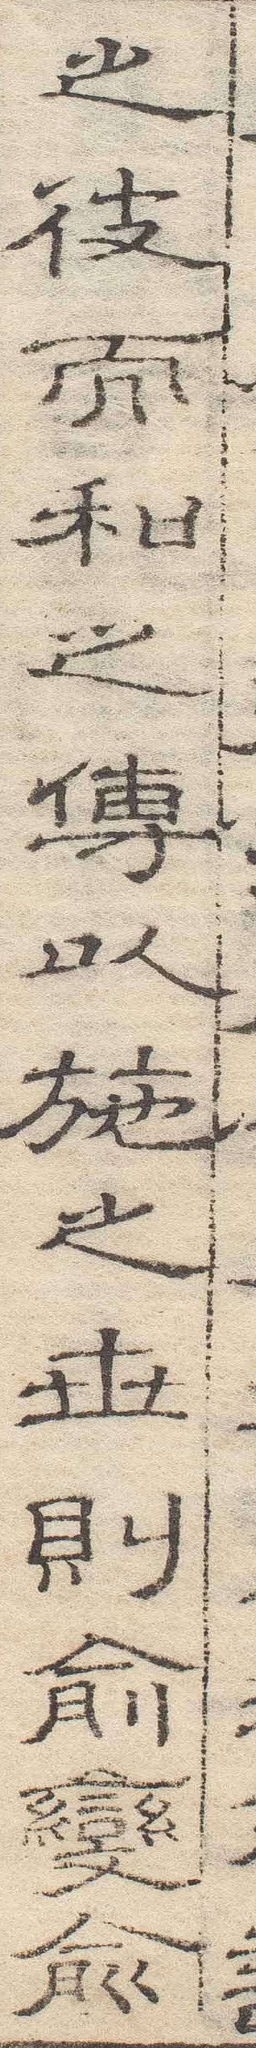之彼而和之伝以施之世則兪変兪
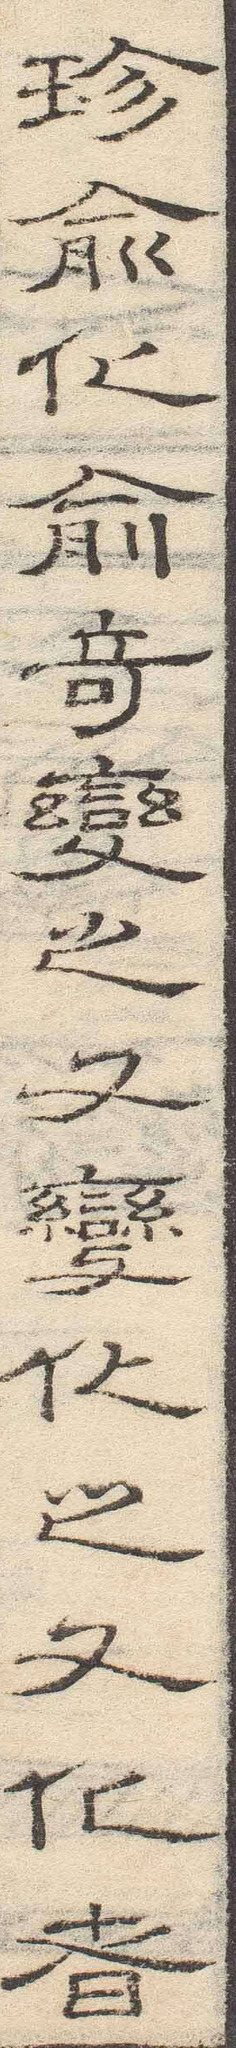珍兪化兪奇変之又変化之又化者
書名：豆腐百珍
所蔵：東京学芸大学附属図書館 国文学研究資料館
